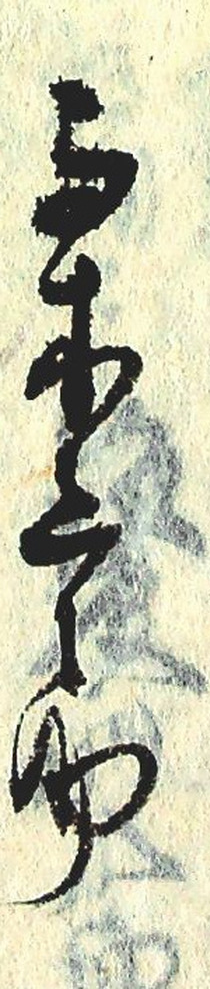高木真之助
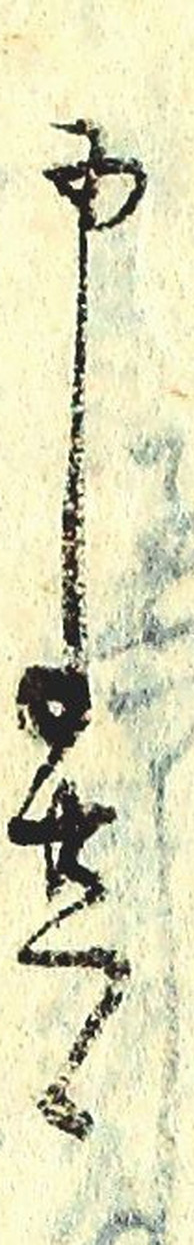五月廿一日
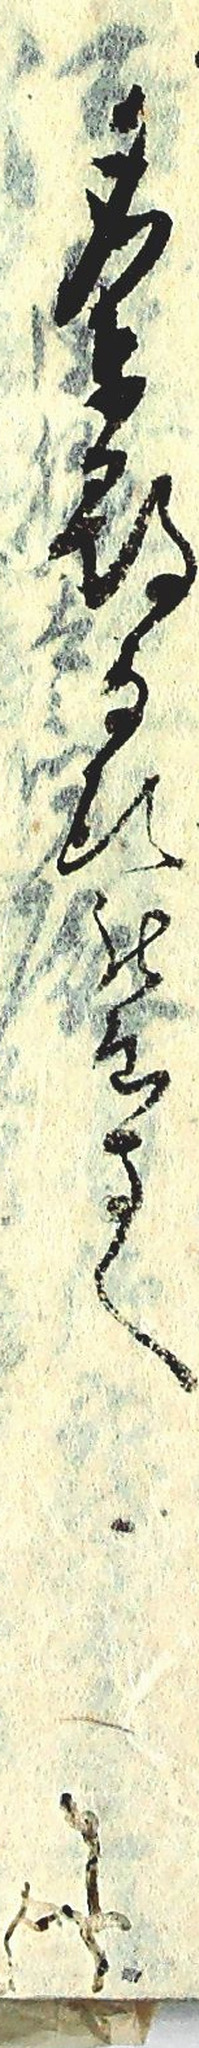名東郡与頭庄屋方へ
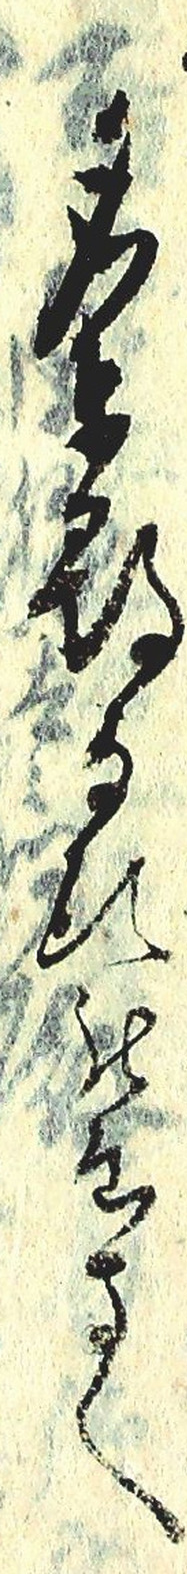名東郡与頭庄屋方へ
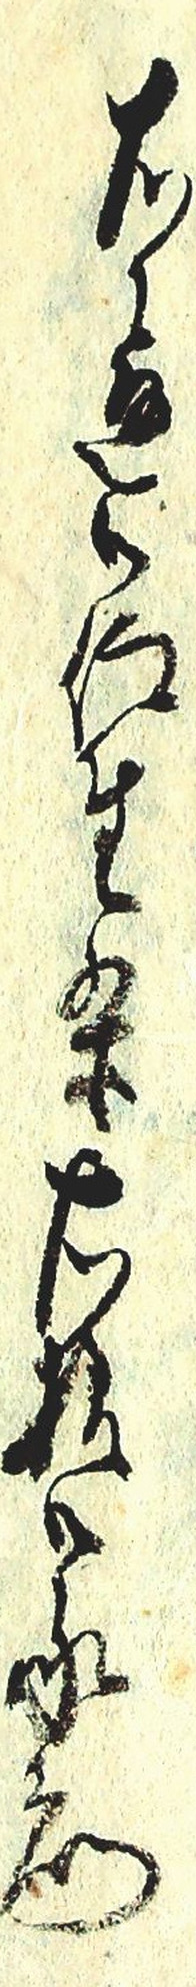右之通被仰付候条右様御承知
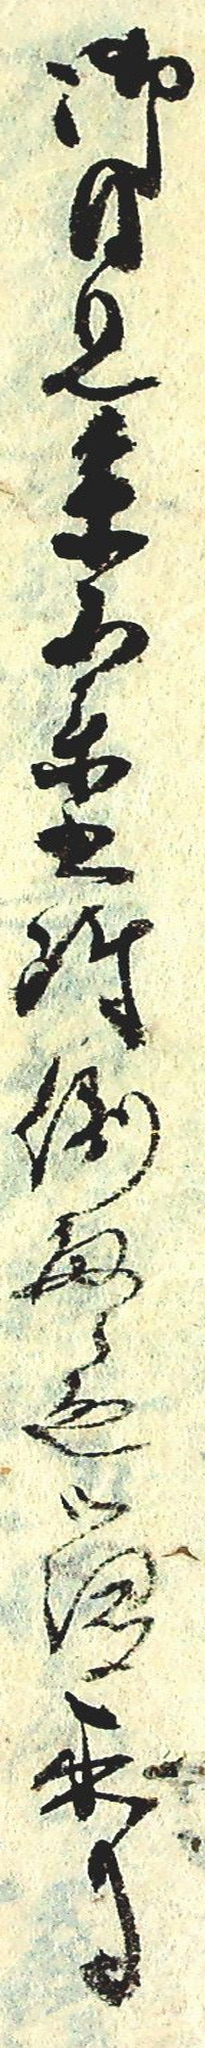御目見参不参書附例毎之通御認め来月
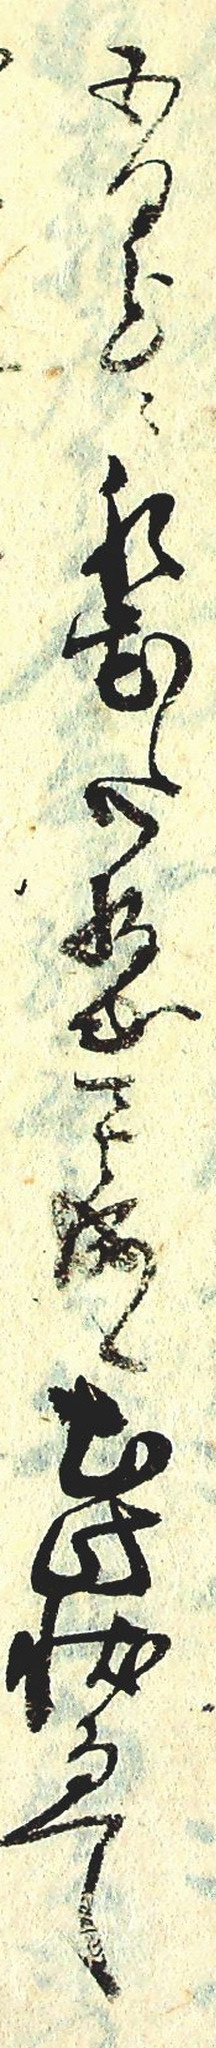五日迄に私宅へ御指出可被成候尤此状急々
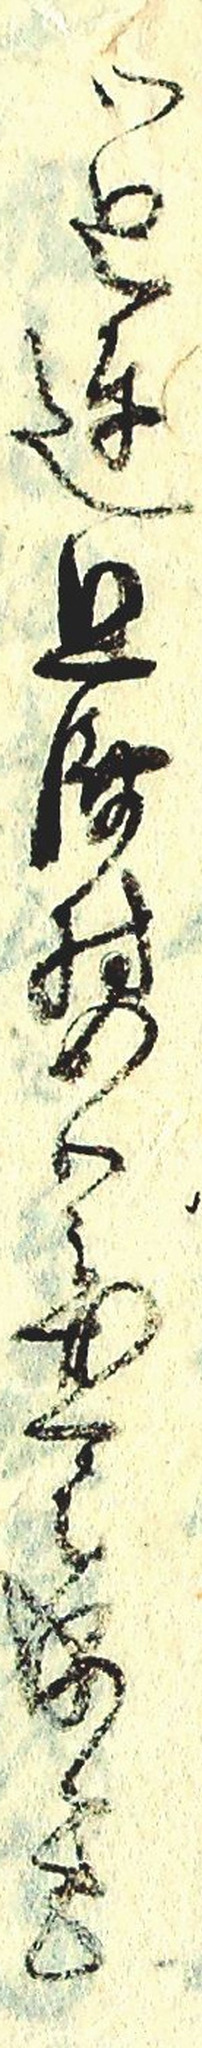御廻達廻済村ゟ御戻可被成候以上
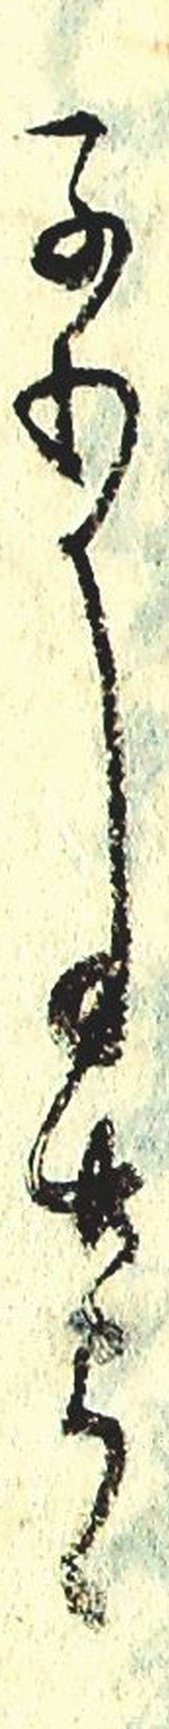子五月廿三日
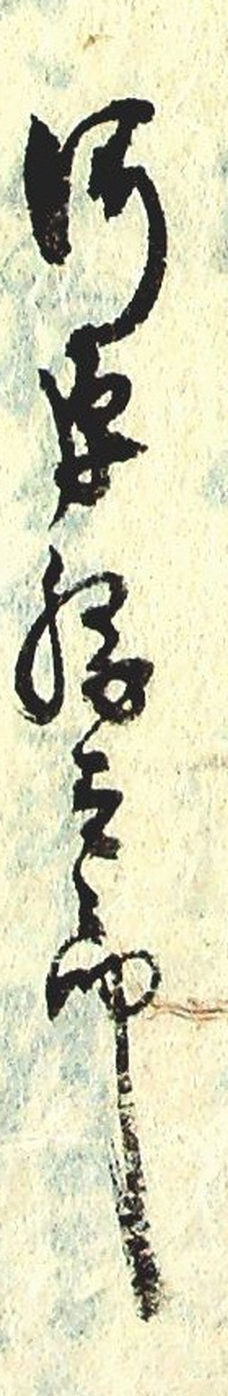河原勝太郎
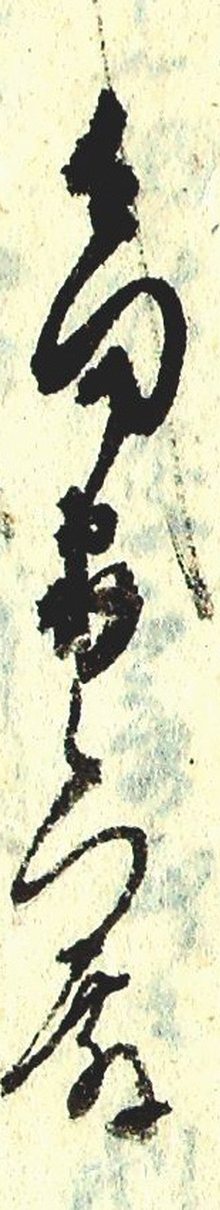今田亀右衛門殿
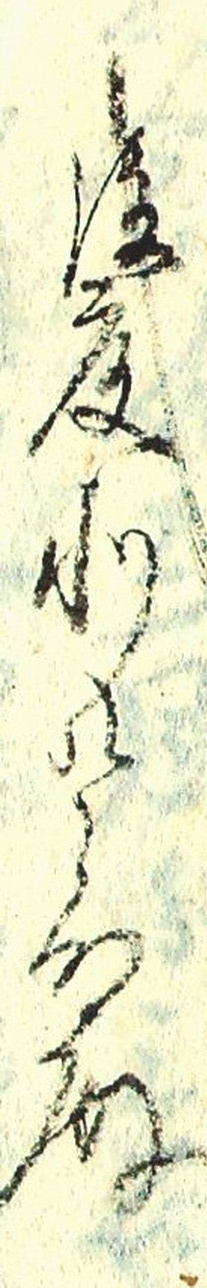後藤利八郎殿
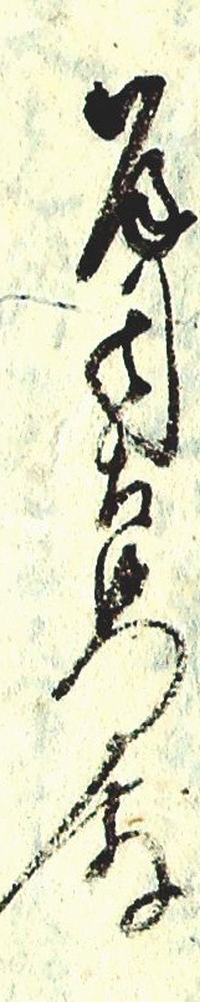岸周左衛門殿

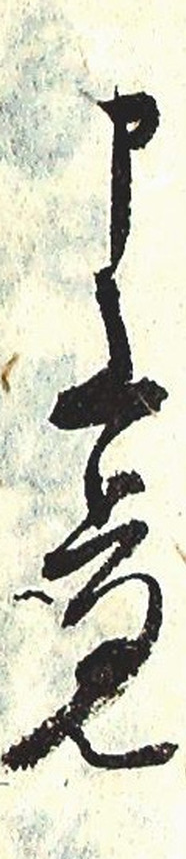申上覚
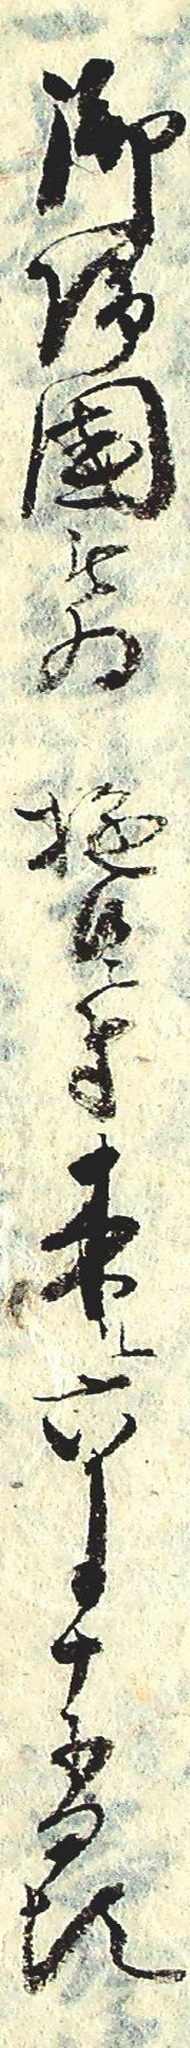御帰国被為遊候に付来る六月十五日頃
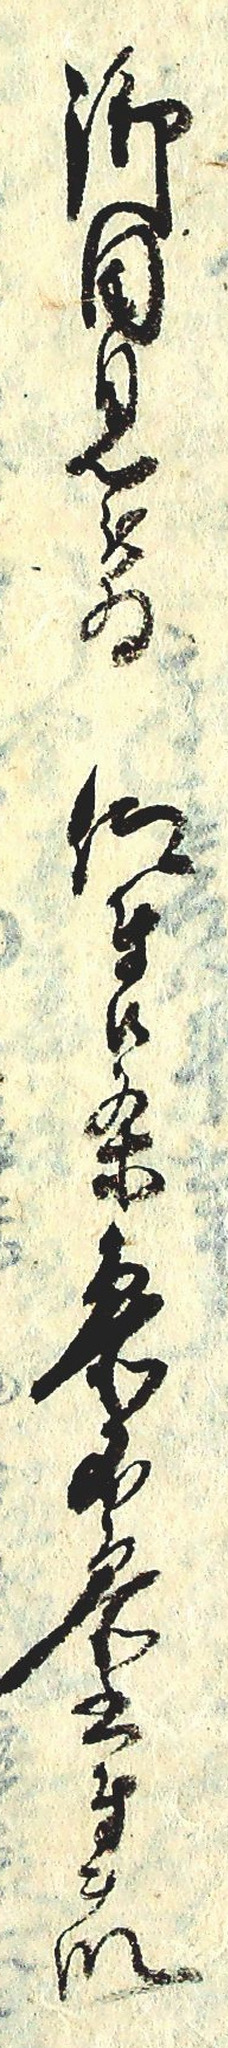御目見被為仰付候条参不参書付を以
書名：諸御願書控(弐番）
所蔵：鳴門教育大学 Naruto University of Education
